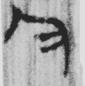今
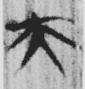夫
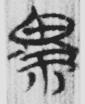{示鬼}（鬼）
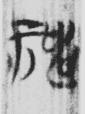神
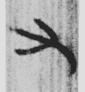又
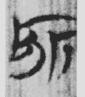所
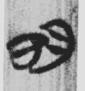明
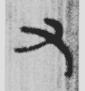又
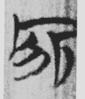所
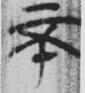不
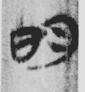明
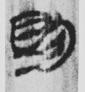則
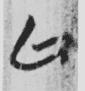㠯
